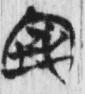○（坉）
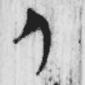人
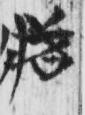戕
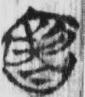鼂
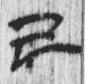己
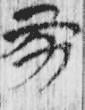亥
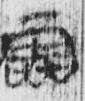霝（靈）
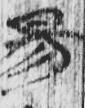昜（陽）
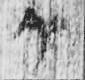人
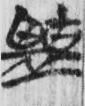○（盬）
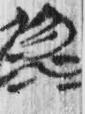溺
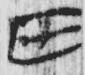甲
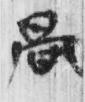晨
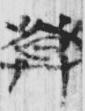登
